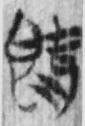既
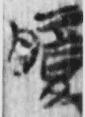腹
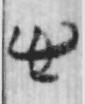心
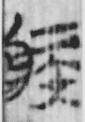疾
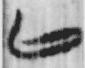㠯（以）
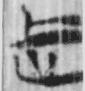上B
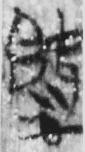○（氣）
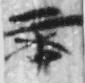不
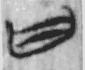甘
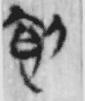○（食）
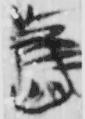舊（久）
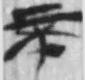不
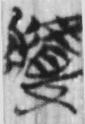○（瘥）
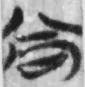尚
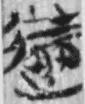速
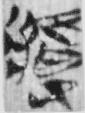○（瘥）
